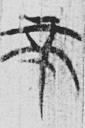不
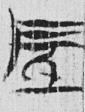砥
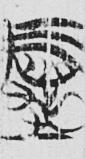○（礪）
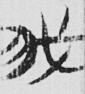我
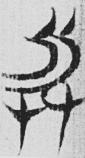兵
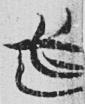必
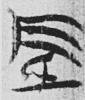砥
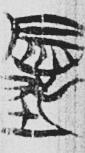○（礪）
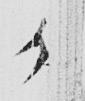人
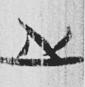之
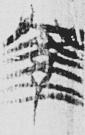{虍㚔}（甲）
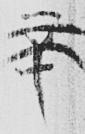不
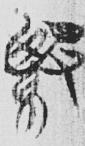{臣日又糸}（堅）
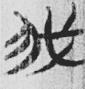我
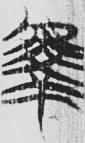○（甲）
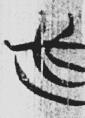必
